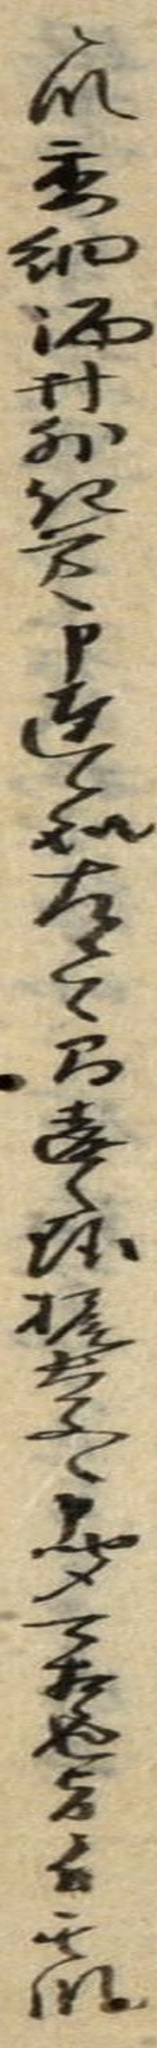候段委細酒井外記方へ申達候処左候はゝ間違之趣梶太夫へ申聞可相返旨に付其段

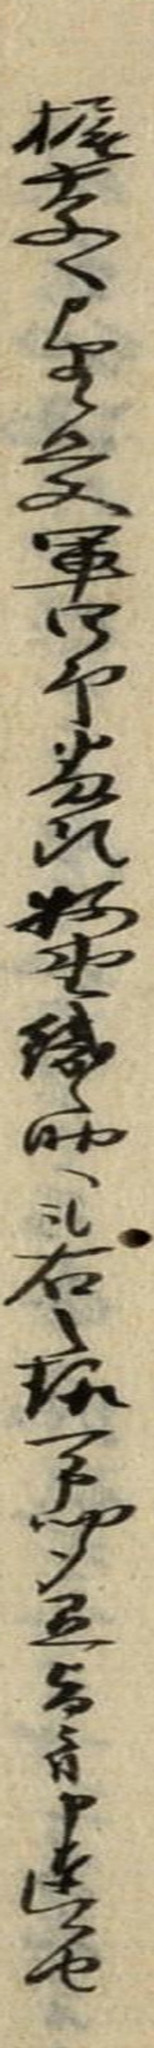梶太夫へ申聞候且又軍四郎番頭牧野織之助へも右之趣可申聞置旨に付申達候由
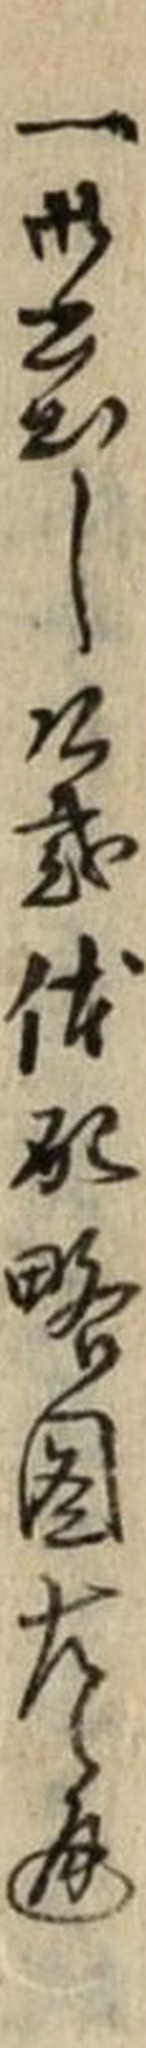一御書出し頂戴体配略図左之通
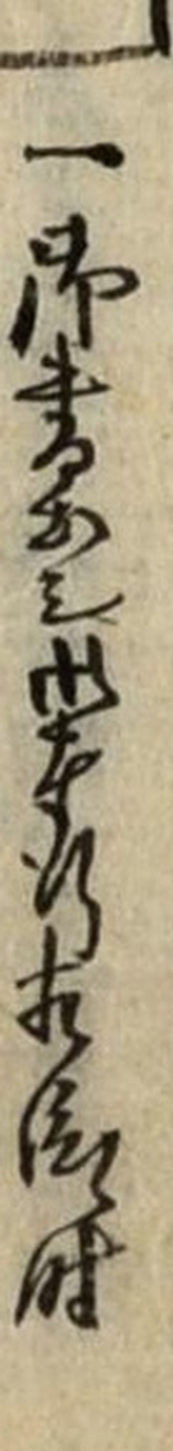一御書出し御奉行相渡候時
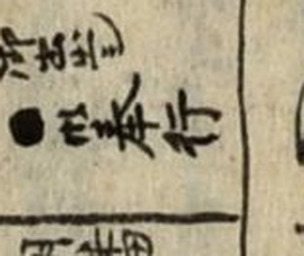●御奉行
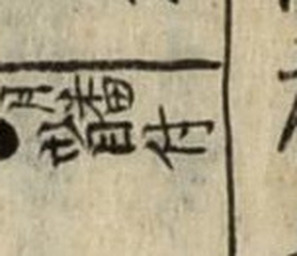●御目付
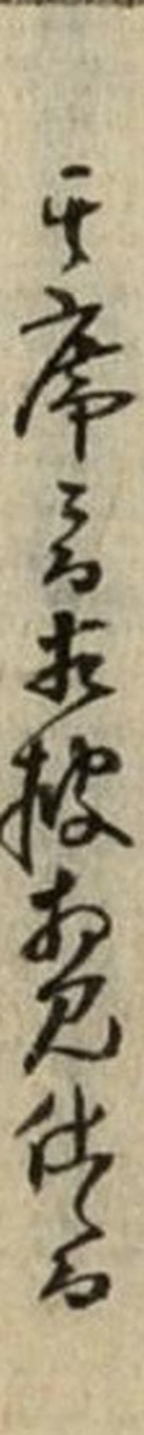其席に而相披拝見仕候而
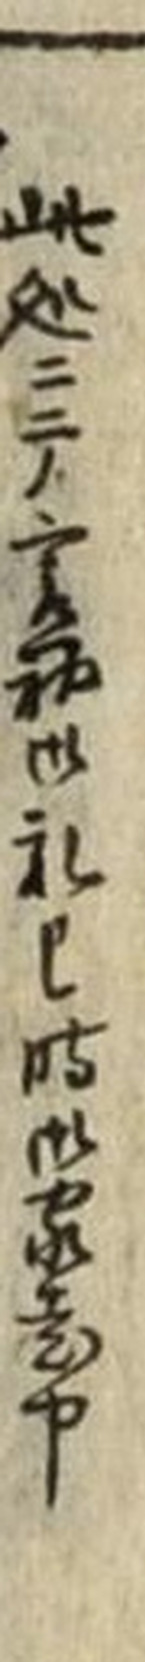△此処に而最初御礼申候時御家老中
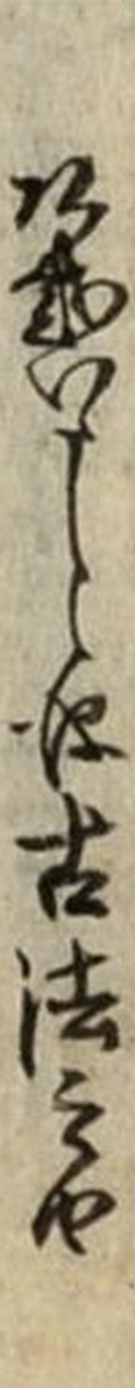頂戴いたし候儀古法之由
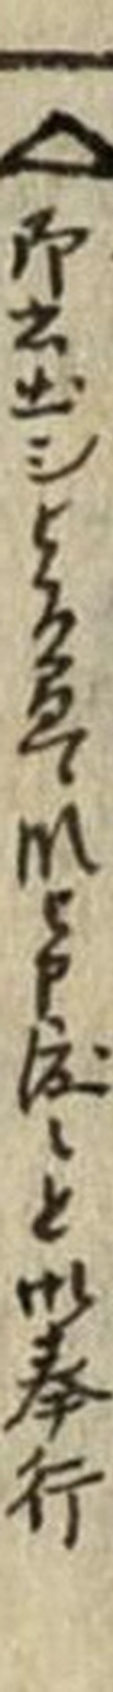御書出し被下置候段被申渡候と御奉行
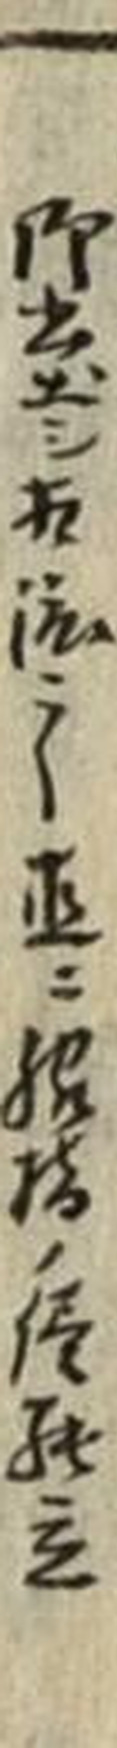御書出し相渡之直ニ脇差之侭罷立
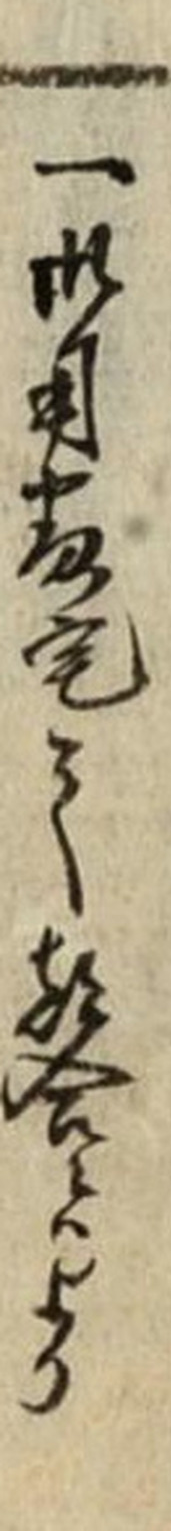一御用番宅之都合にはより
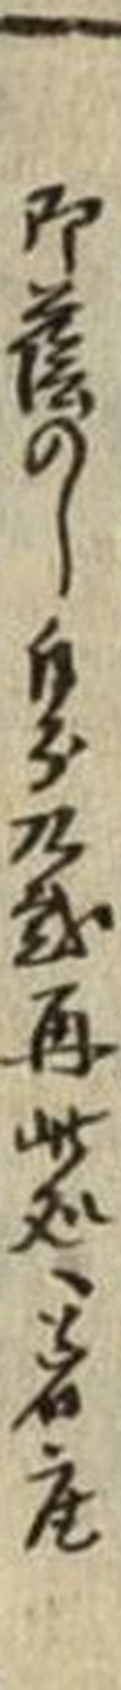御蔭のし自分頂戴再此処へ着座
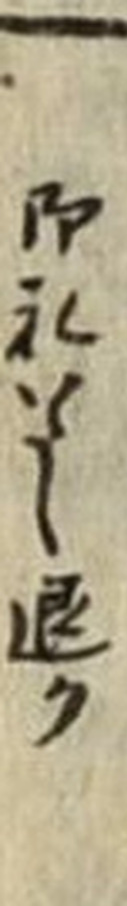御礼いたし退く
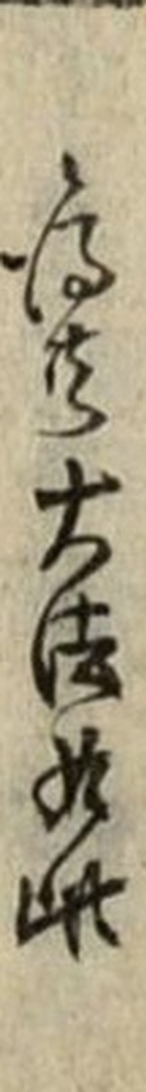候得共古法如此
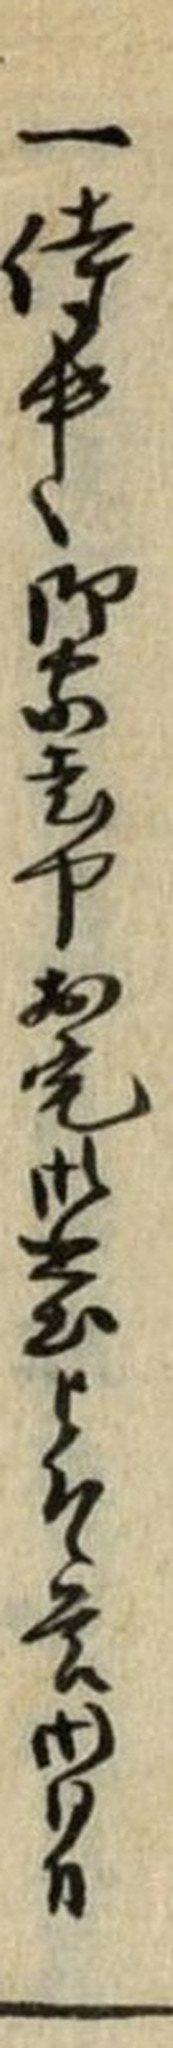一侍中へ御家老中於宅御書出被下候節御目付
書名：御用并被仰出之部
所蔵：福井県文書館 Fukui Prefectural Archives
